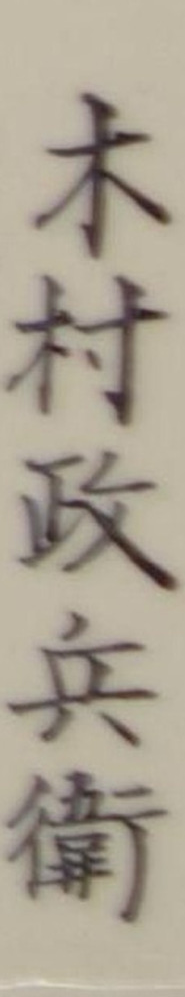木村政兵衛
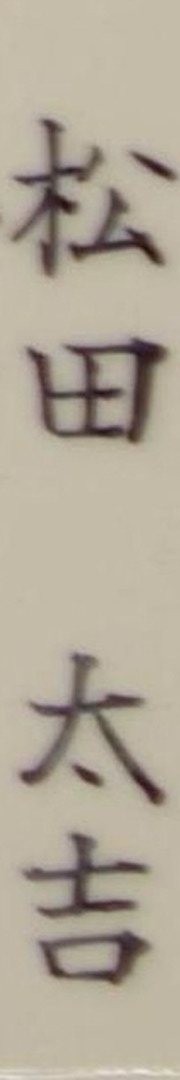松田太吉
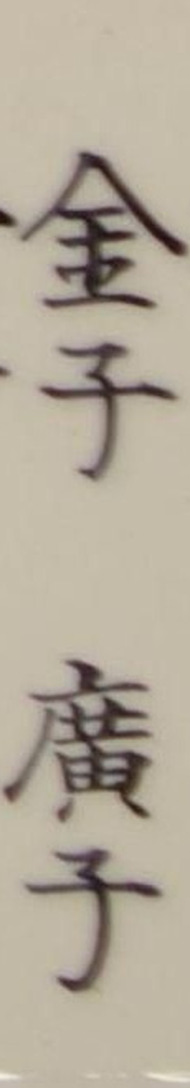金子廣子
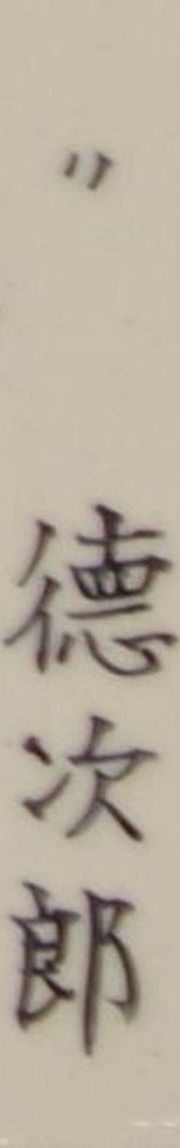徳次郎
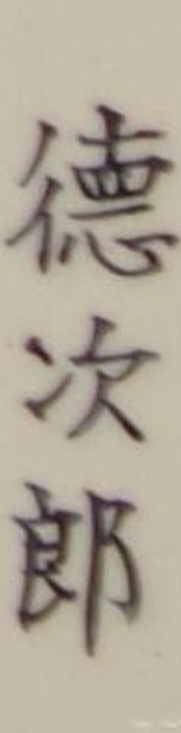徳次郎
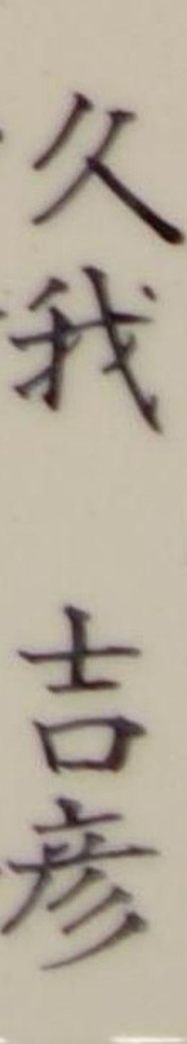久我吉彦
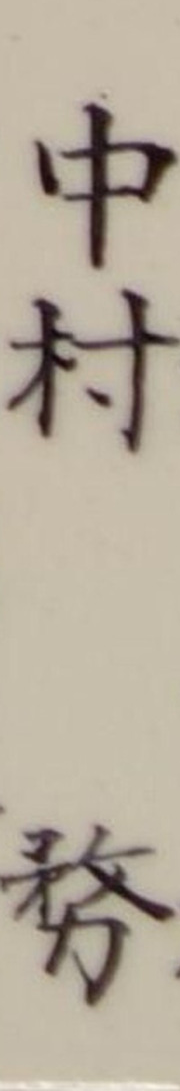中村務
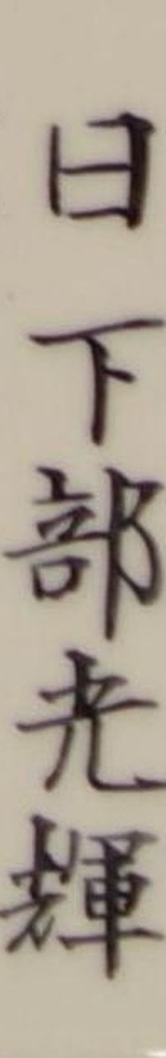日下部光輝
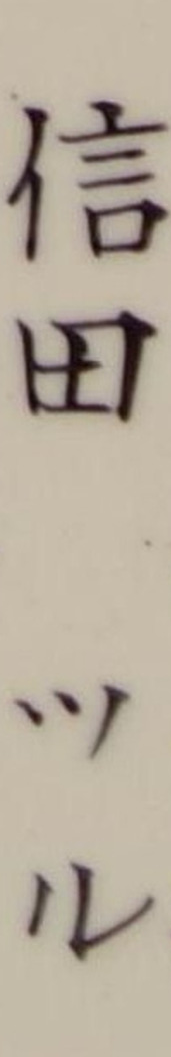信田ツル
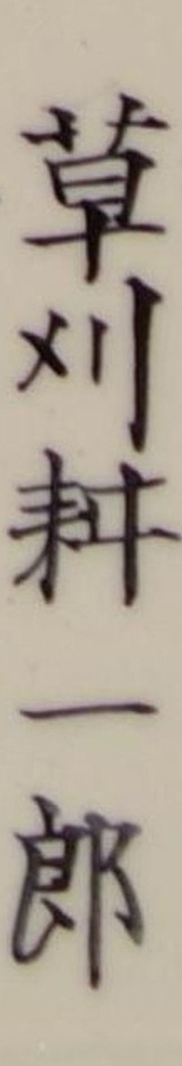草刈耕一郎
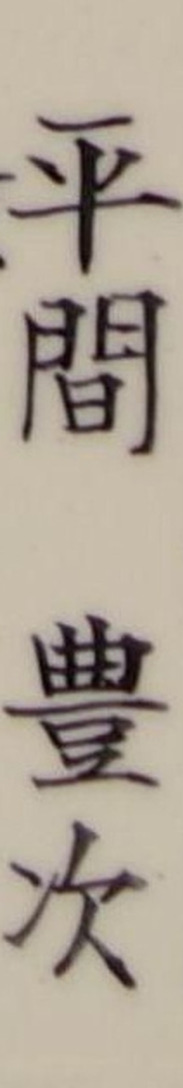平間豊次
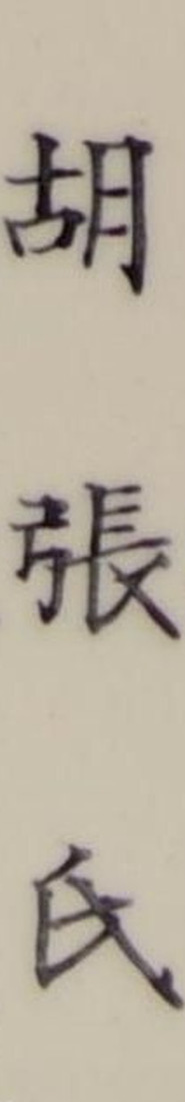胡張氏
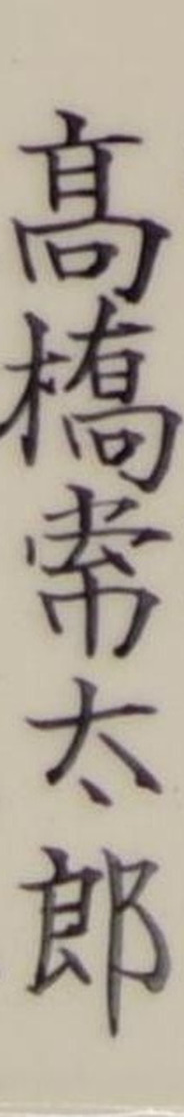高橋常太郎
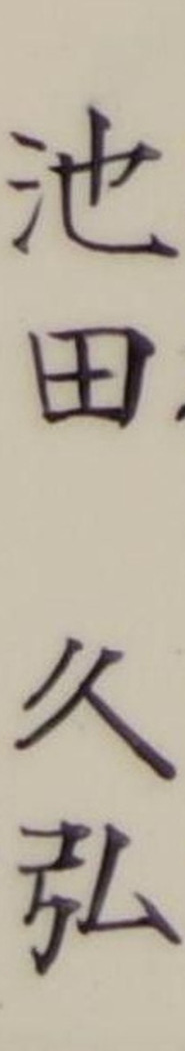池田久弘
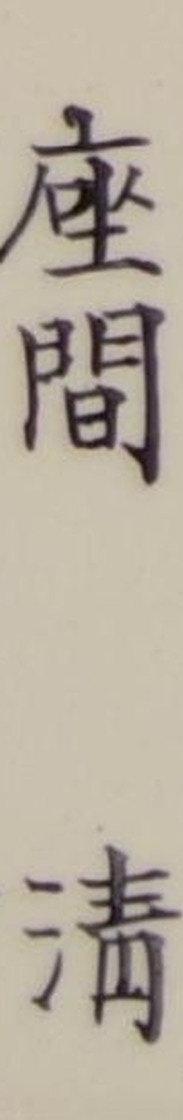座間清
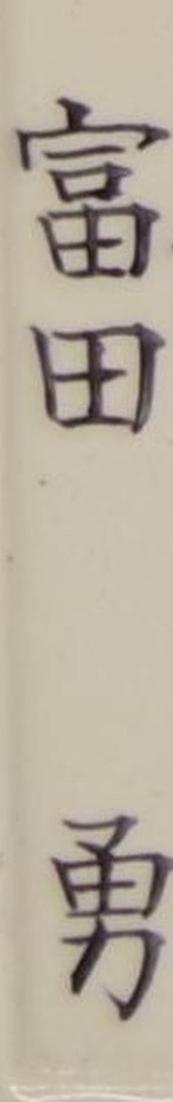富田勇
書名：M~S
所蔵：高野山金剛峯寺
